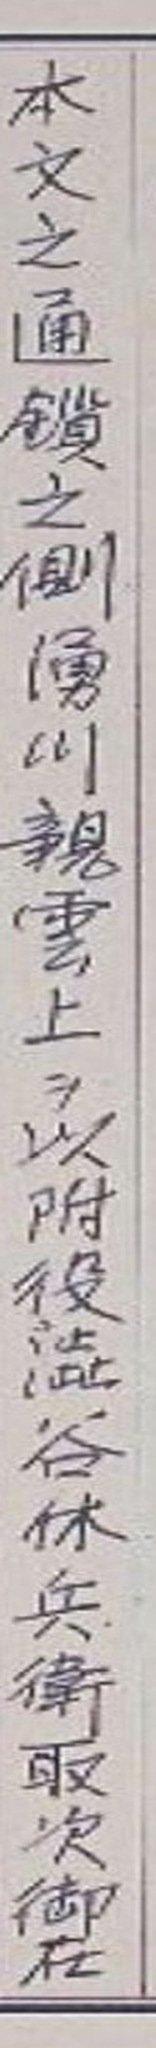本文之通鎖之側湧川親雲上を以附役渋谷休兵衛取次御在
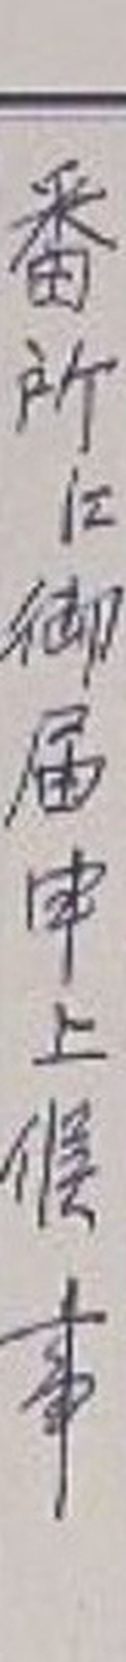番所え御届申上候事
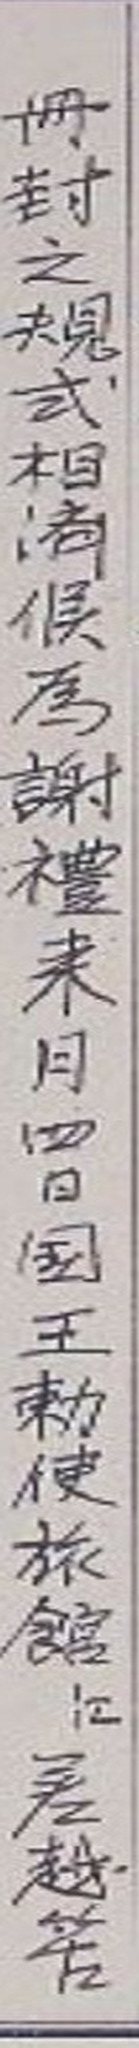冊封之規式相済候為謝礼来月四日国王勅使旅館え差越筈
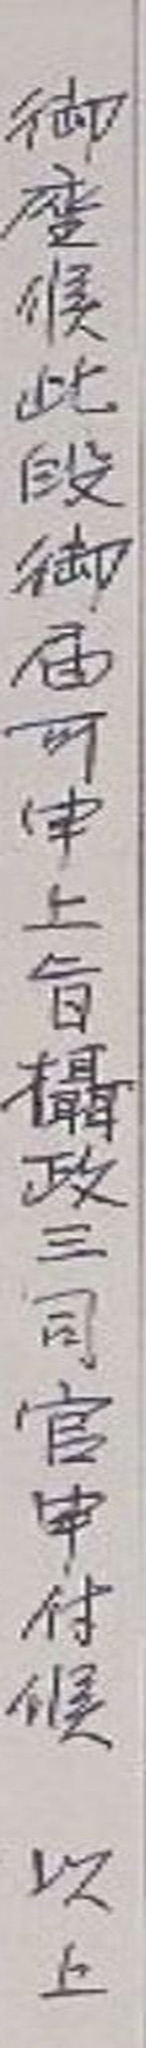御座候此段御届可申上旨摂政三司官申付候以上
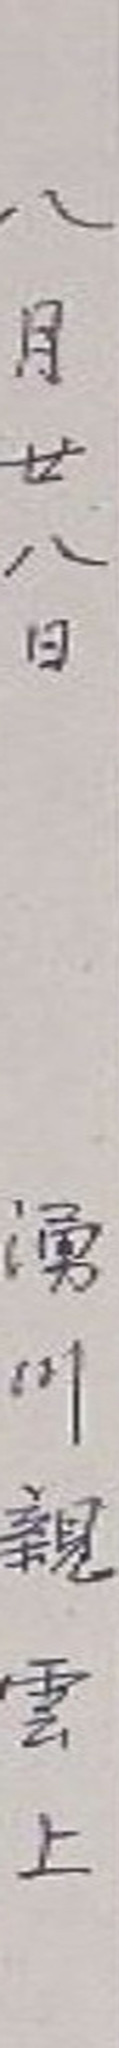八月廿八日湧川親雲上
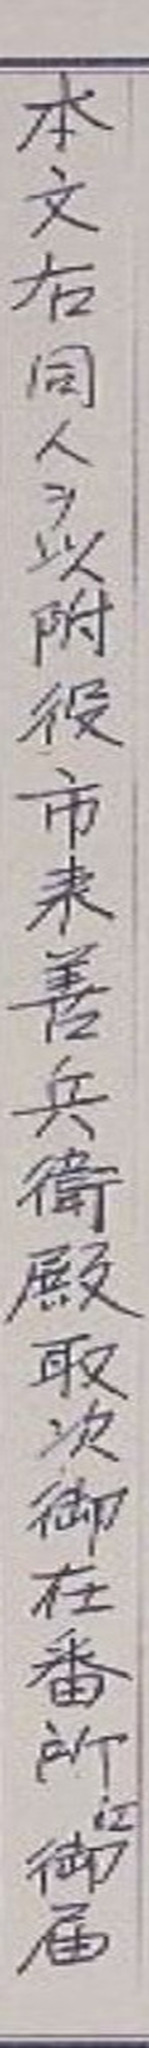本文右同人を以附役渋谷休兵衛殿取次御在番所え御届

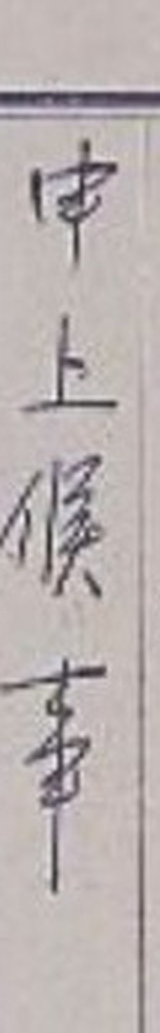申上候事
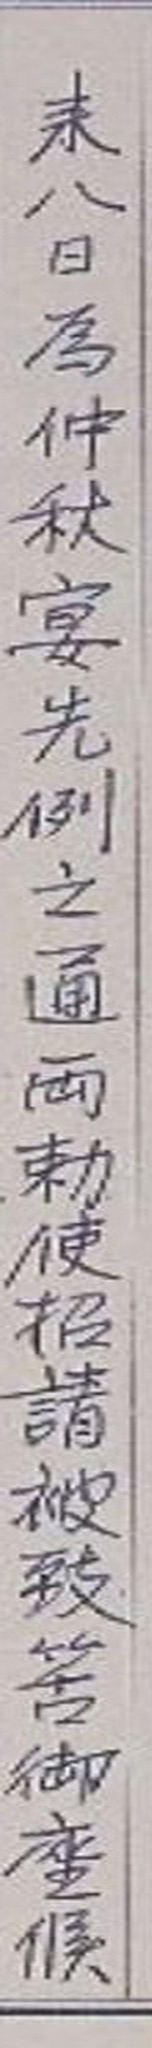来八日為仲秋宴先例之通両勅使招請被致筈御座候
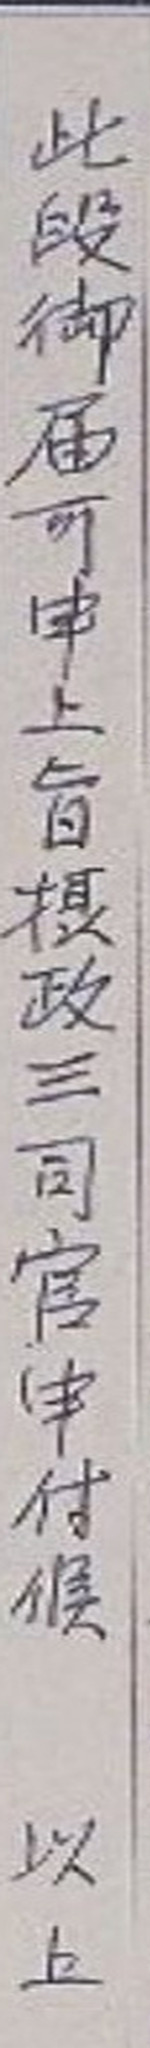此段御届可申上旨摂政三司官申付候
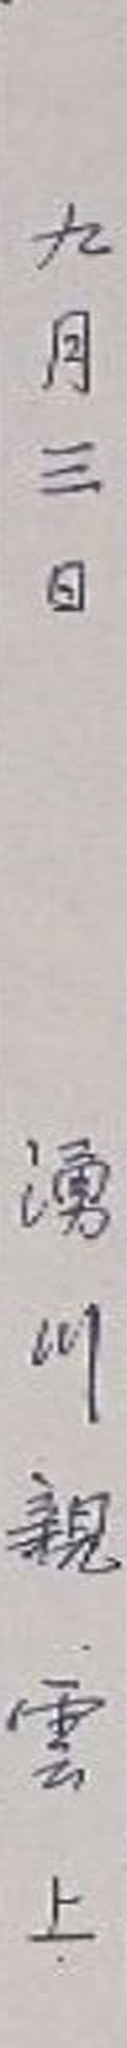九月三日湧川親雲上
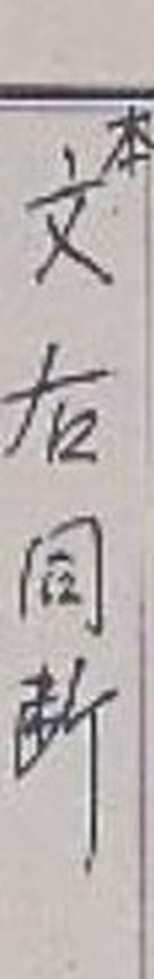本文右同断
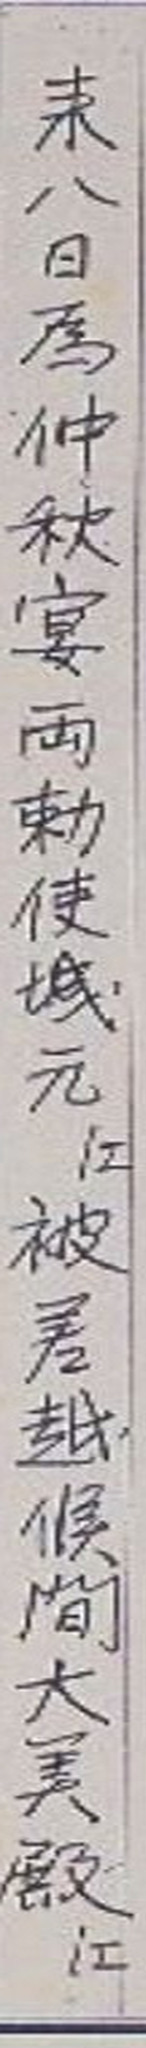来八日為仲秋宴両勅使城元え被差越候間大美殿え
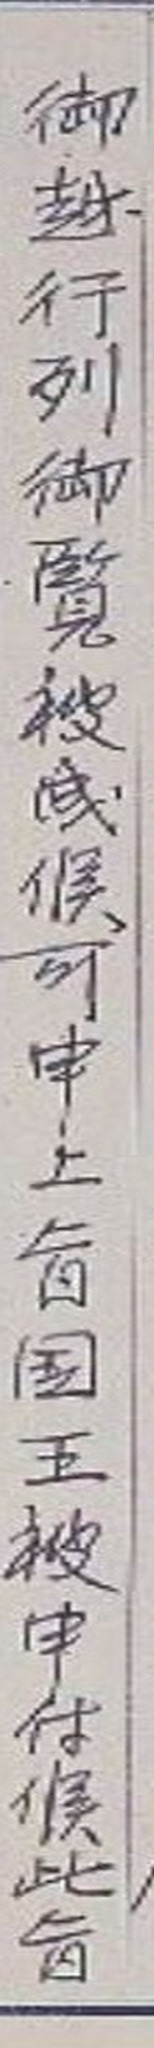御越行列御覧被成候可申上旨国王被申付候此旨
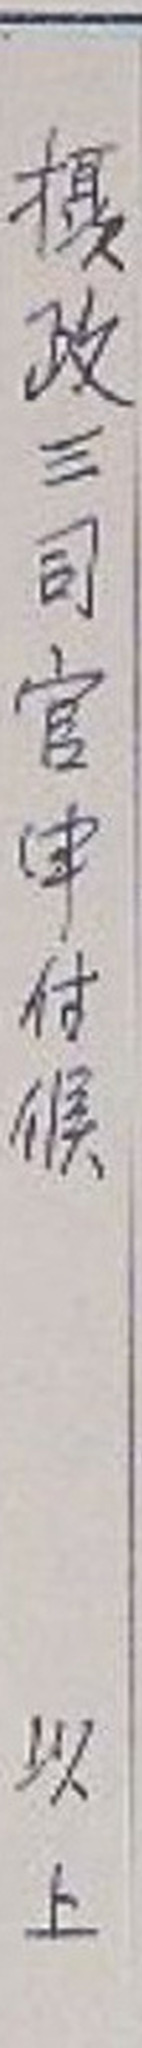摂政三司官申付候以上
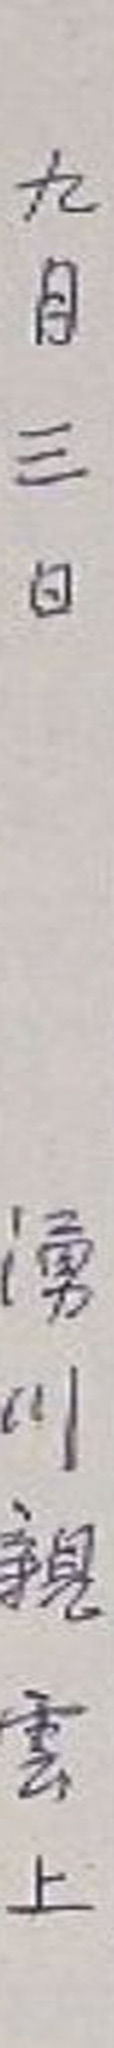九月三日湧川親雲上
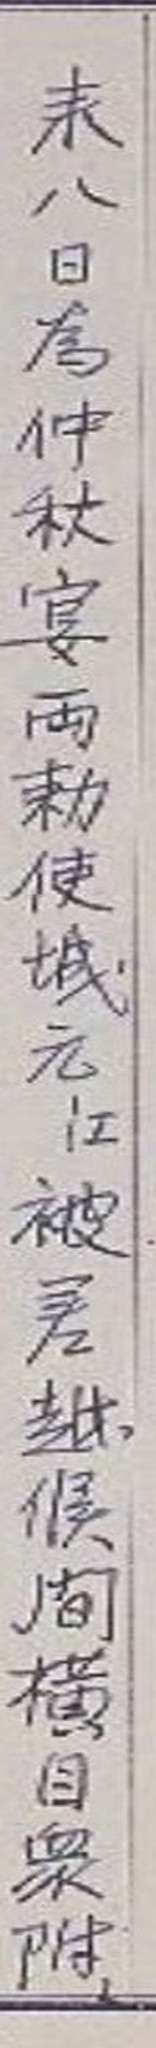来八日為仲秋宴両勅使城元え被差越候間横目衆附
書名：支那冊封使来琉諸記 下巻
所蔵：University of the Ryukyus Library
